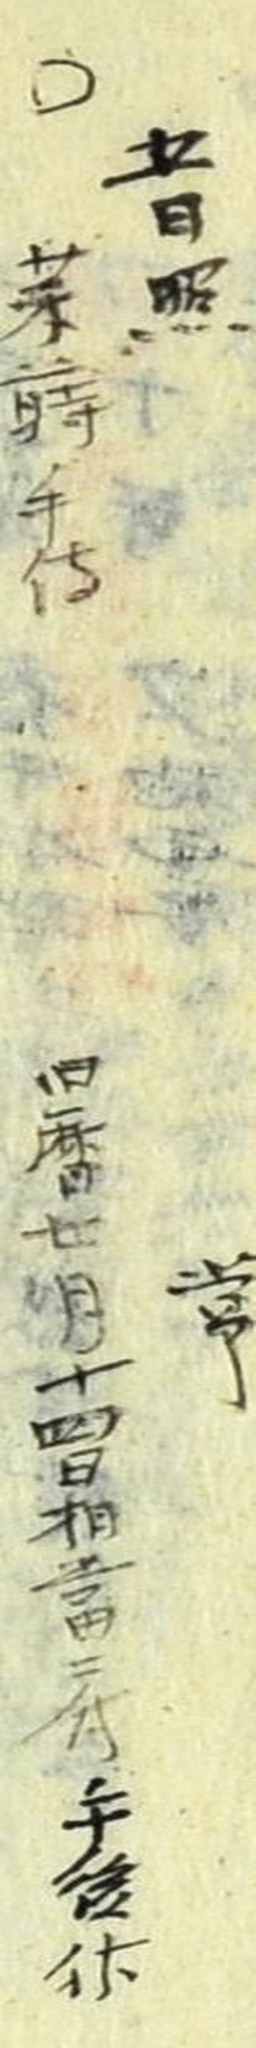○菜蒔手伝旧暦七月十四日相当ニ付午後休
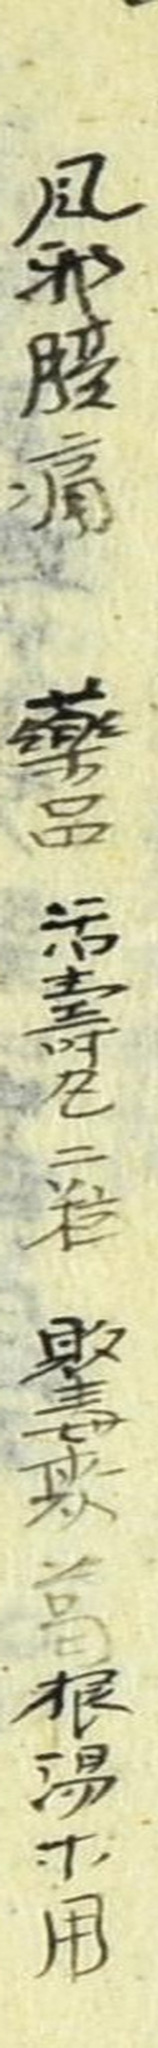○風邪腹痛薬品活寿丸二粒敗毒散葛根湯等用
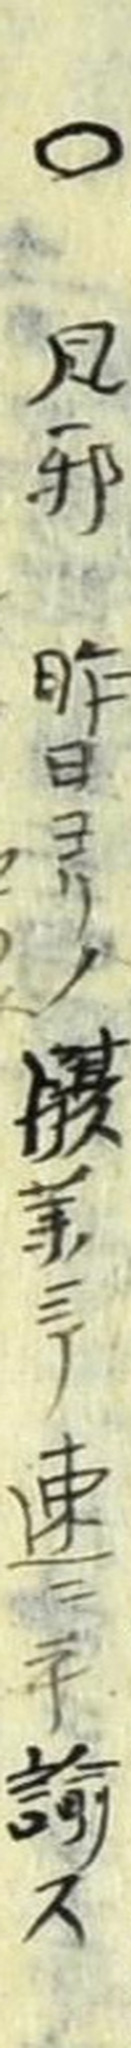○風邪昨日ヨリノ腹薬ニテ速ニ平諭ス
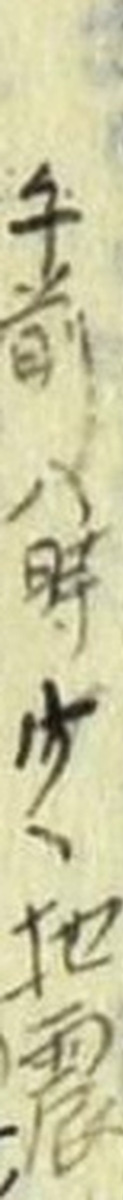午前八時少々地震
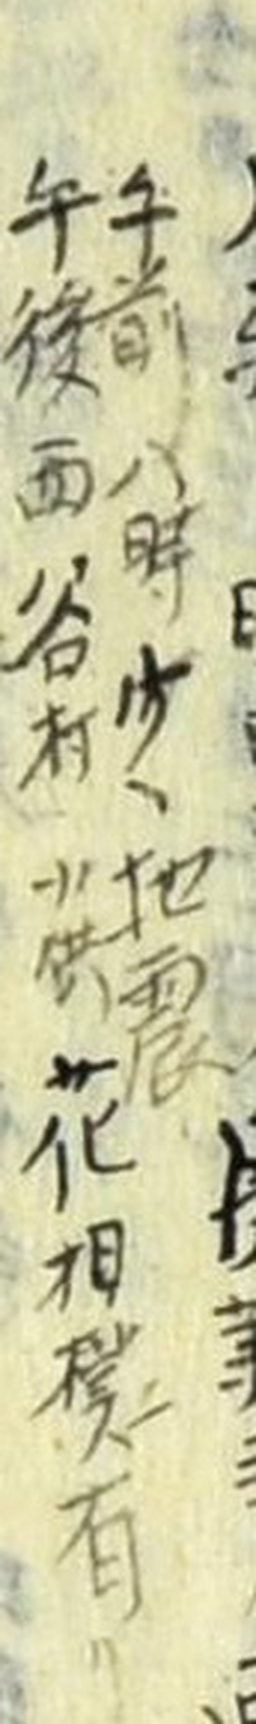午後西谷村小供花相撲有リ
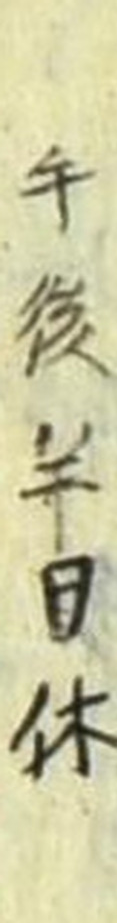午後半日休

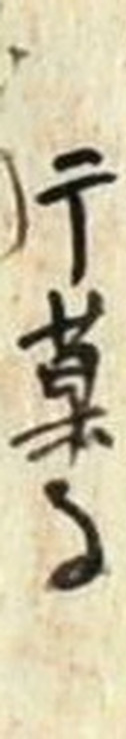干菓子
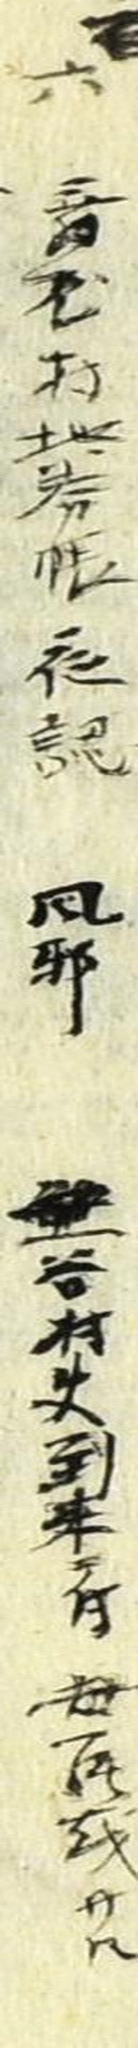舞屋村地券夜認風邪笹谷村使到来ニ付母罷越サル
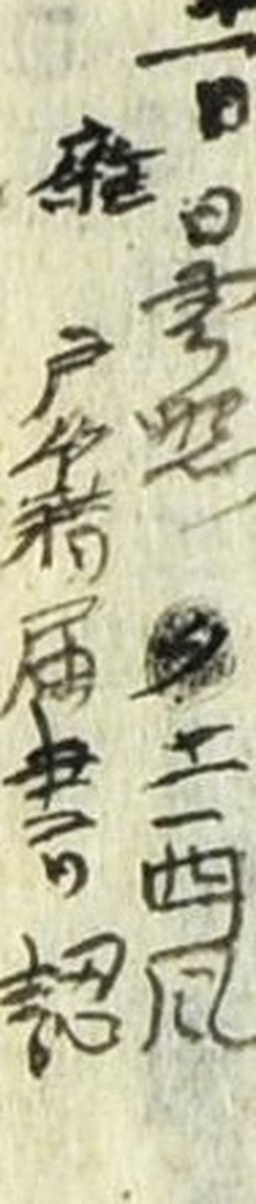雑戸籍届書認
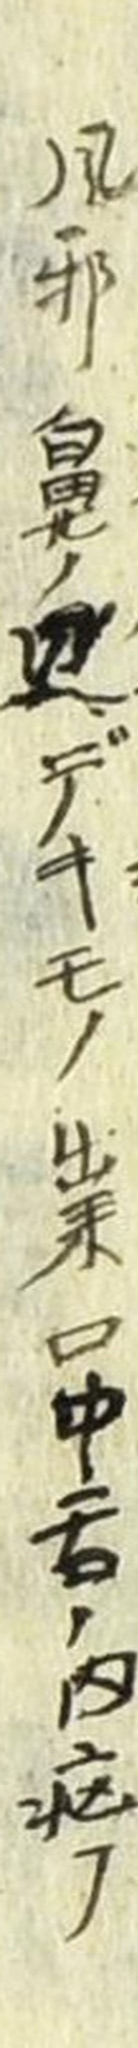風邪鼻ノ辺デキモノ出来口中舌ノ内病フ
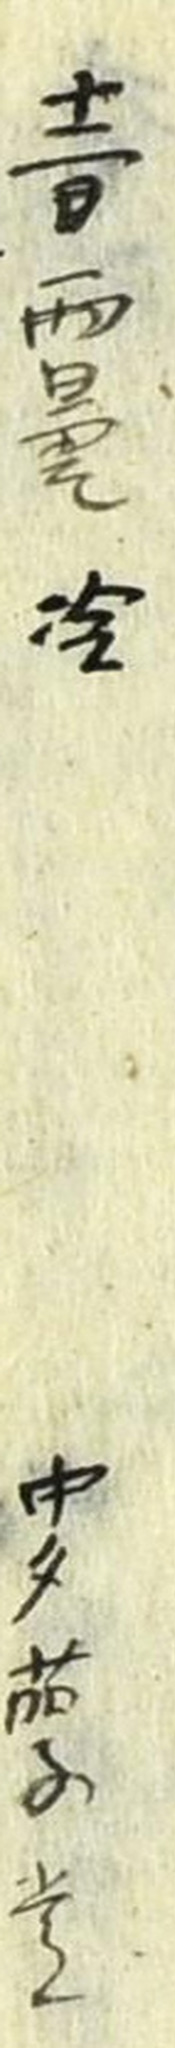十二日雨曇冷中夕茄子常
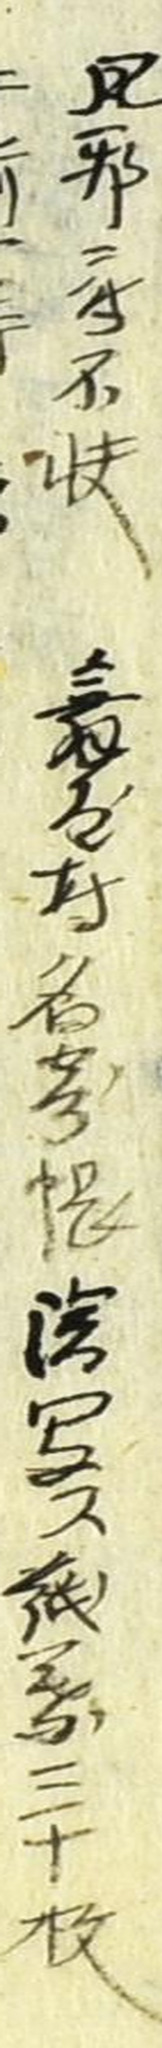風邪ニ付不快舞屋村名寄帳写ス紙葉三十枚
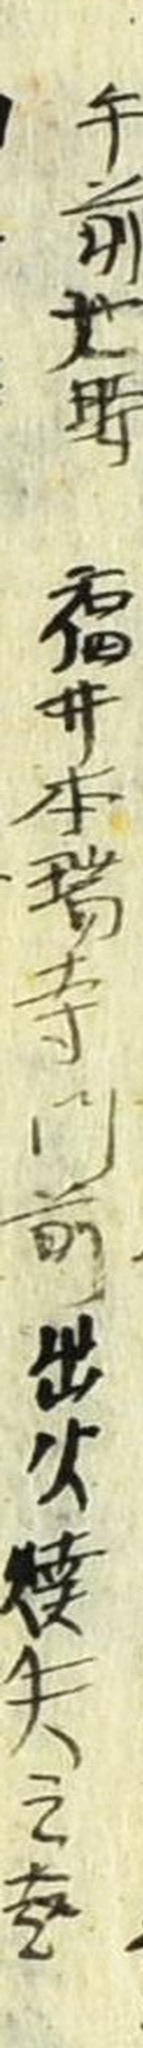午前七時福井本瑞寺門前出火焼失之趣
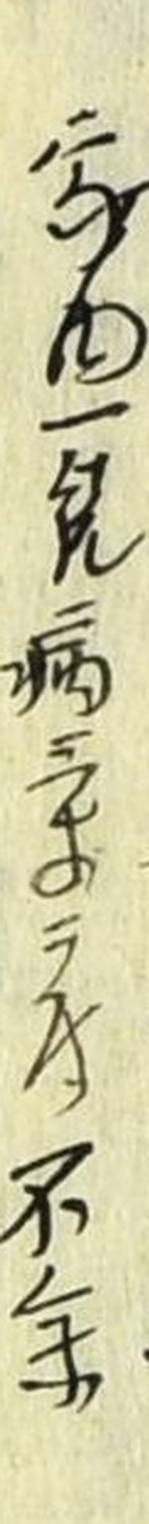家内一統病気ニ付不参
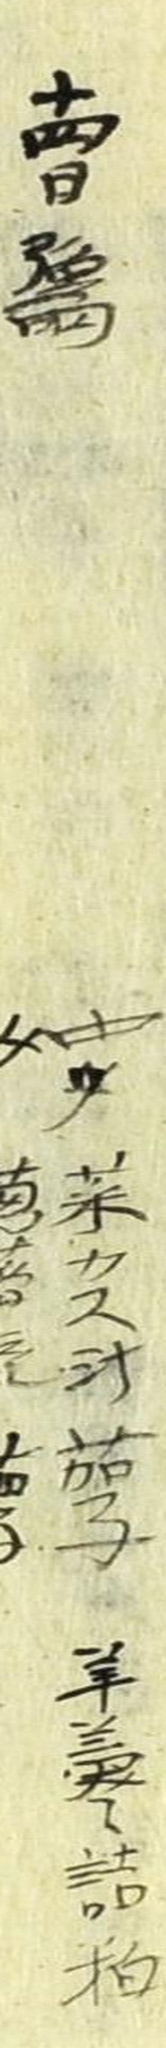十四日強雨中夕菜カス汁茄子羊羹詰粕
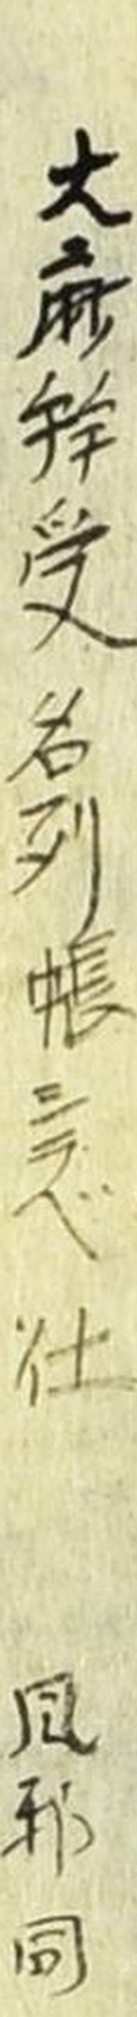大麻拝受名列帳シラベ仕風邪同
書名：（日記）
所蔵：福井県文書館 Fukui Prefectural Archives
